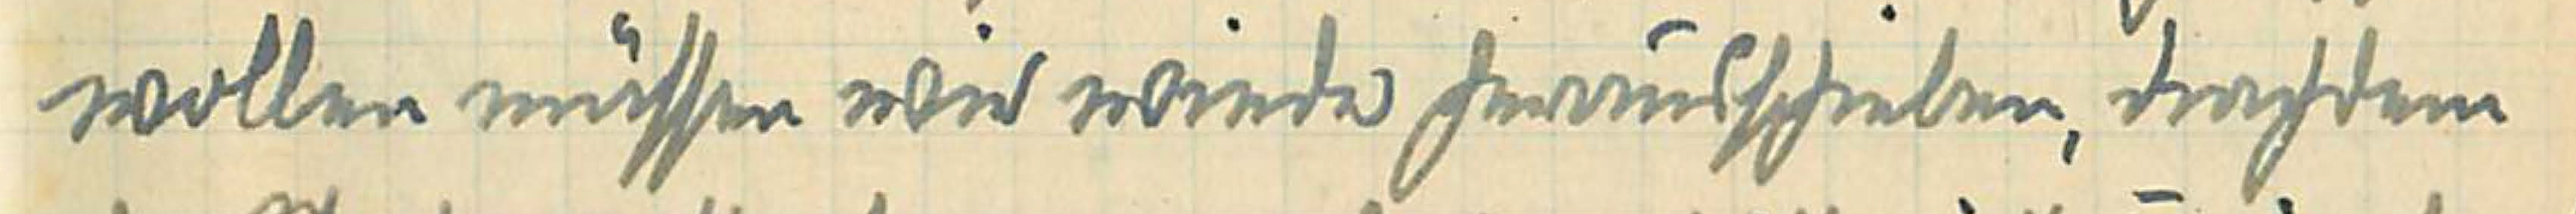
wollen müssen wir wieder herausschieben, nachdem
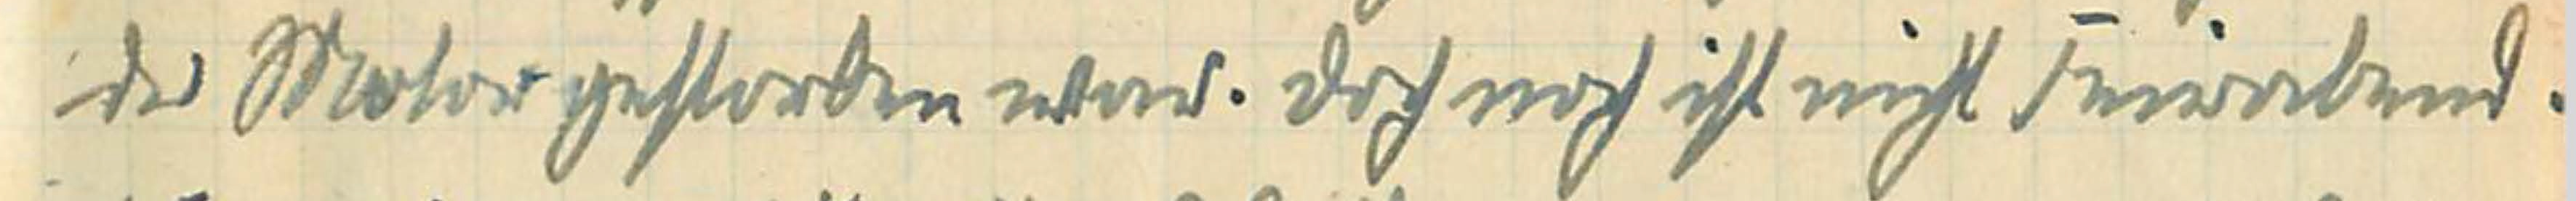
der Motor gestorben war. Doch noch ist nicht Feierabend.
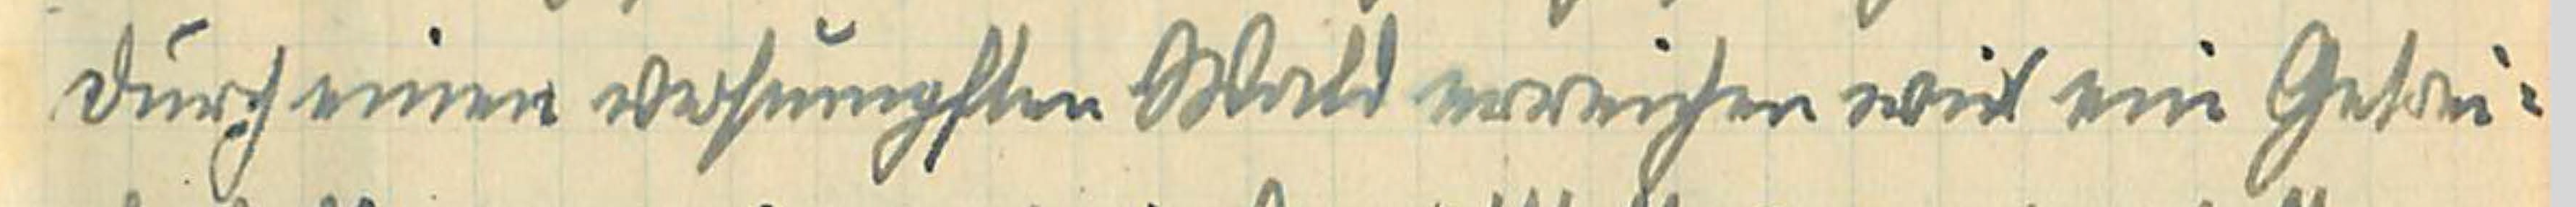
Durch einen versumpften Wald erreichen wir ein Getrei-
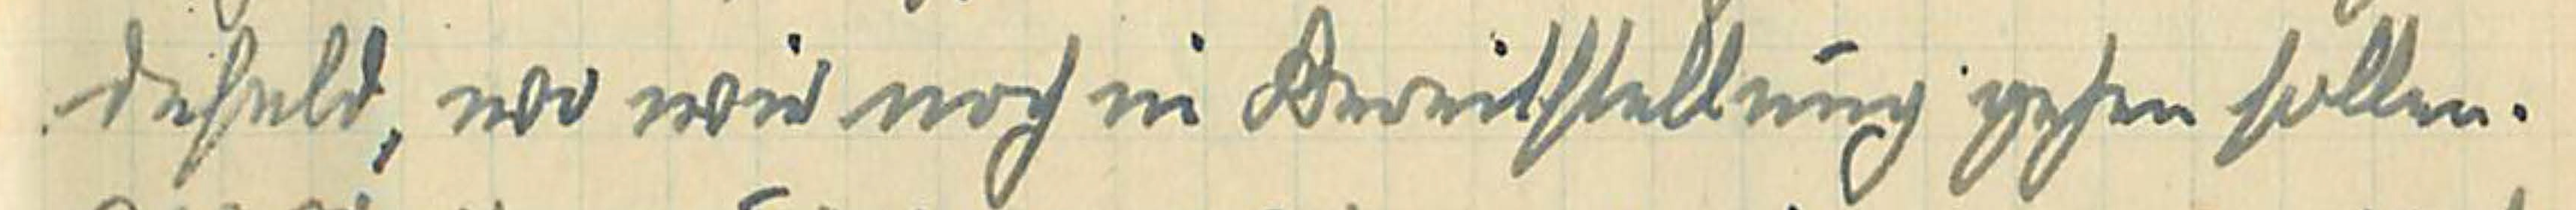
defeld, wo wir noch in Bereitstellung gehen sollen.
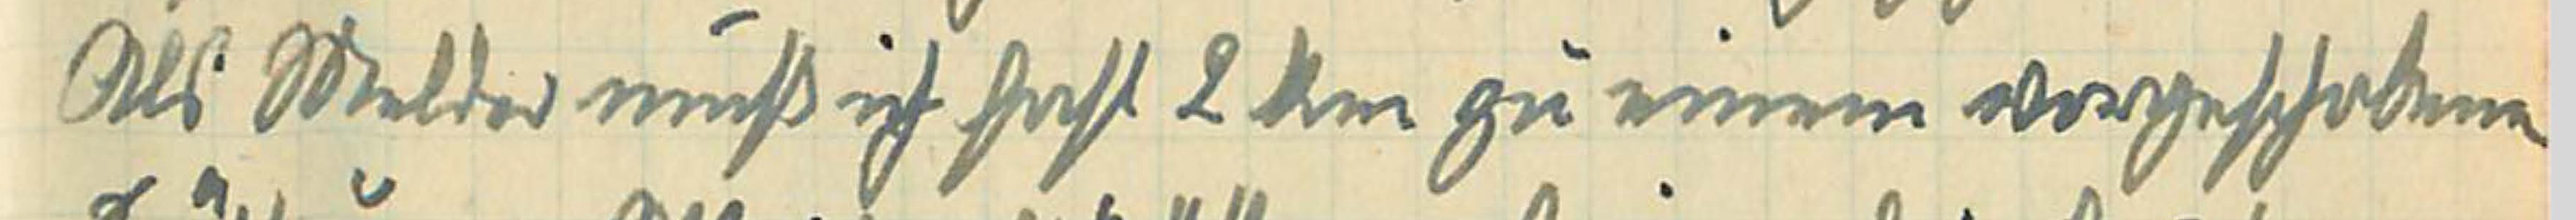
Als Melder muß ich fast 2 km zu einem vorgeschobenen
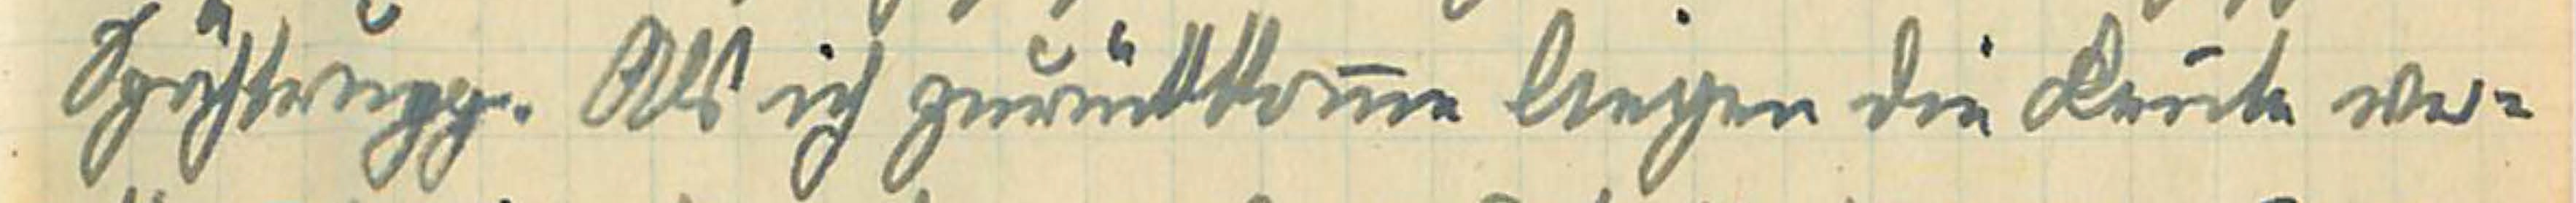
Spähtrupp. Als ich zurückkomme liegen die Leute ver-
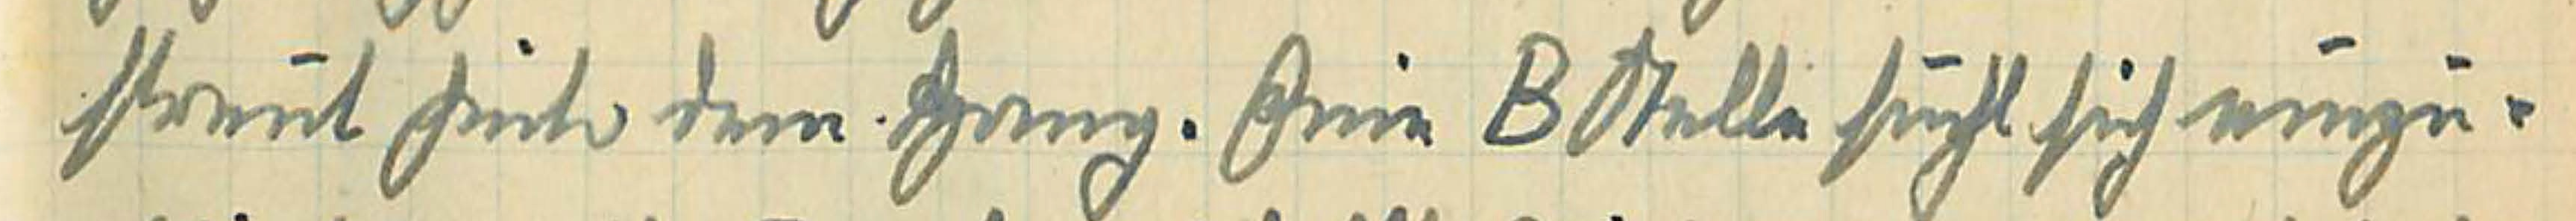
streut hinter dem Hang. Eine B Stelle sucht sich einzu-
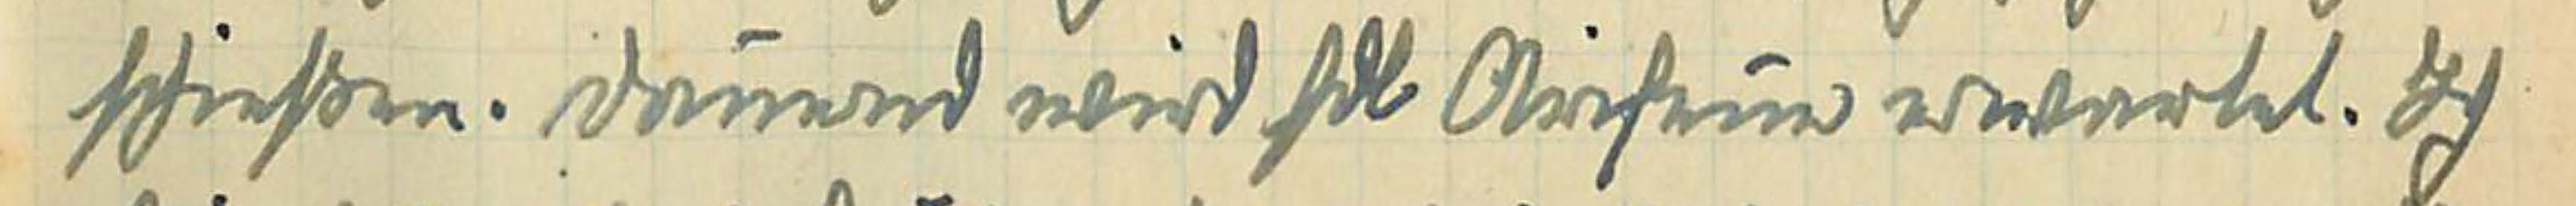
schießen. Dauernd wird fdl Arifeuer erwartet. Ich
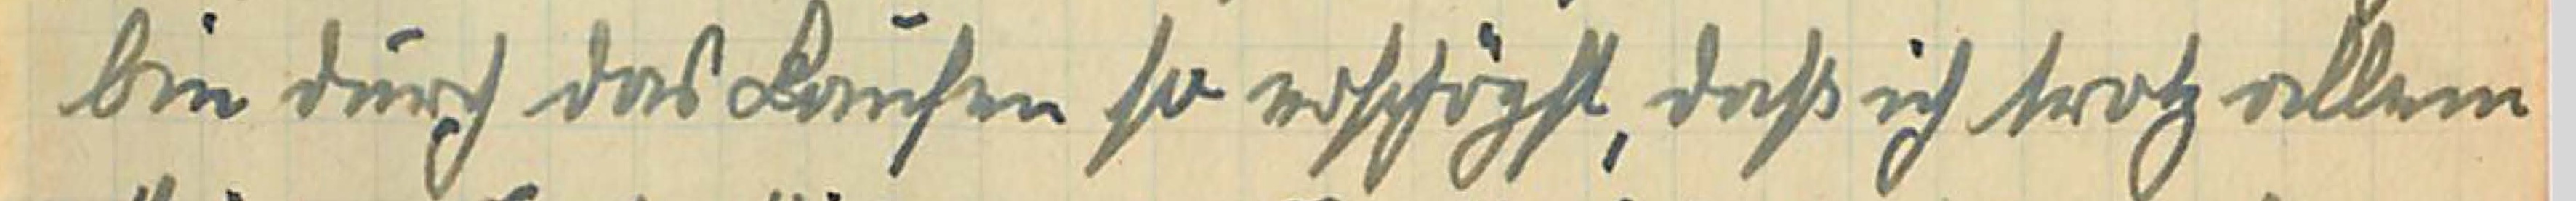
bin durch das Laufen so erschöpft, daß ich trotz allem
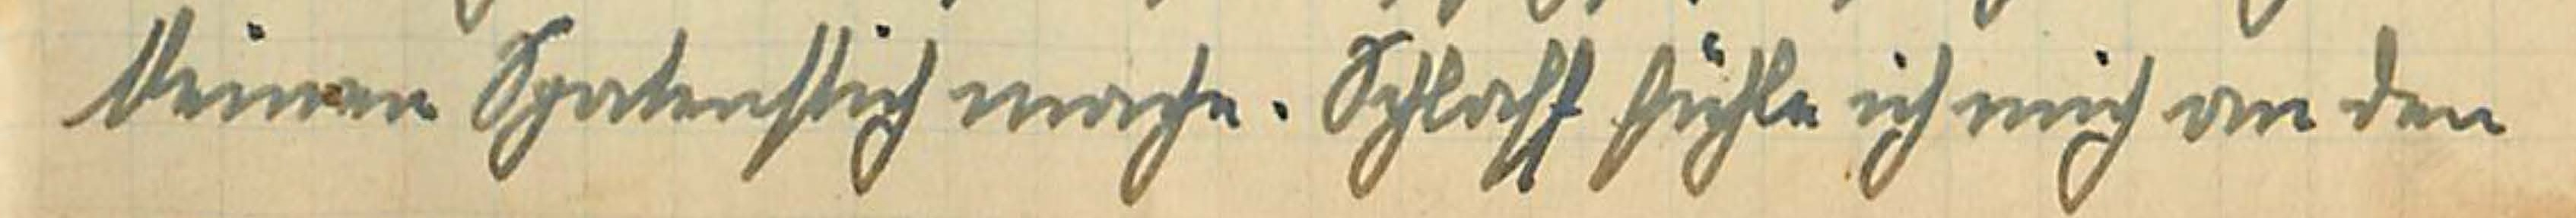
keinen Spatenstich mache. Schlaff fühle ich mich an den
